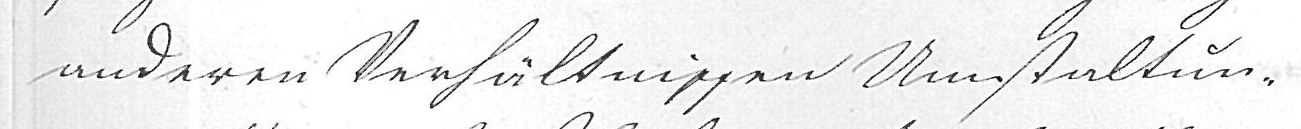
anderen Verhältnissen Umstaltun-
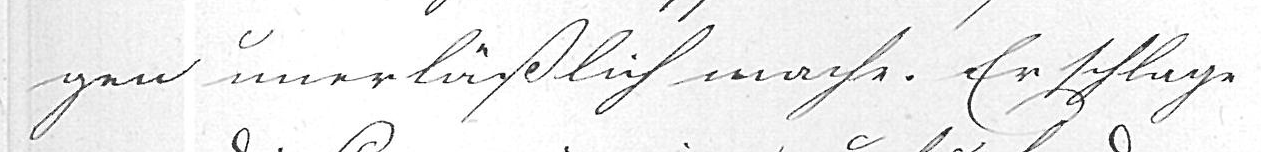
gen unerläßlich mache. Er schlage
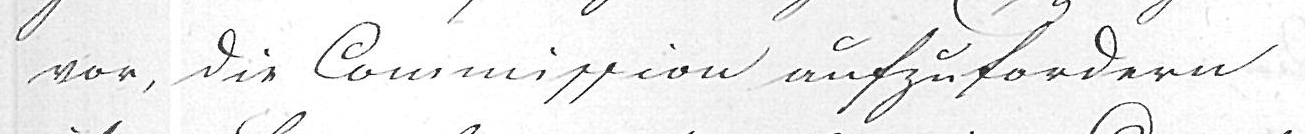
vor, die Commission aufzufordern
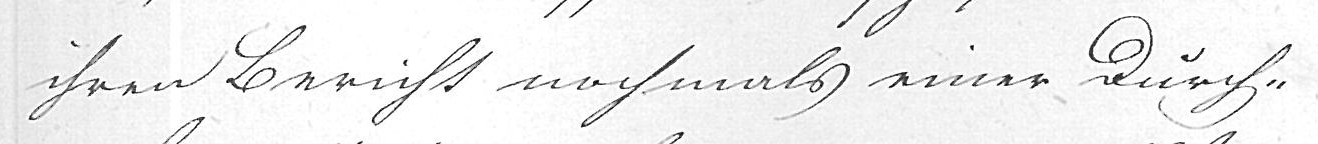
ihren Bericht nochmals einer Durch-
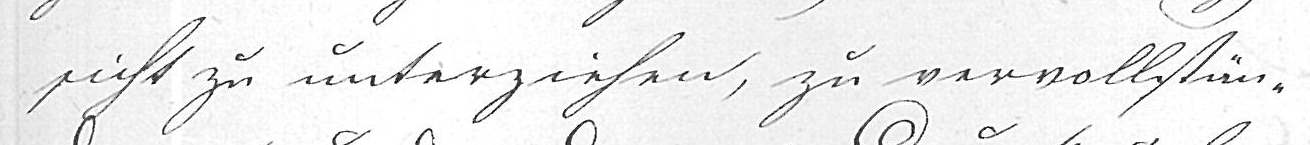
sicht zu unterziehen, zu vervollstän-
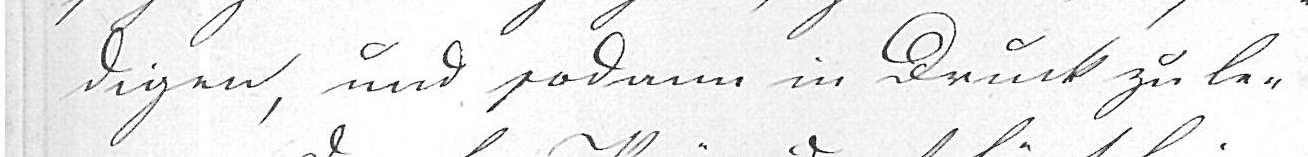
digen und sodann in Druck zu le-
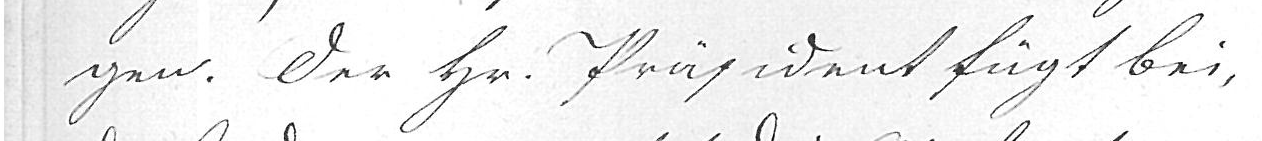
gen. Der Hr. Präsident führt bei,
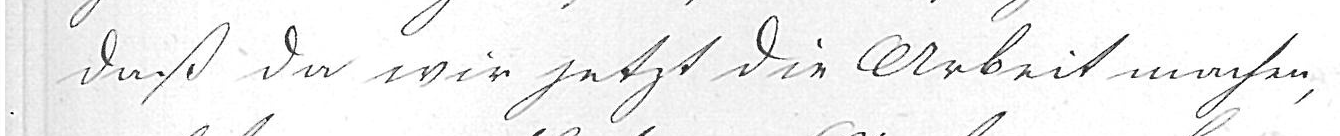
daß da wir jetzt die Arbeit machen,
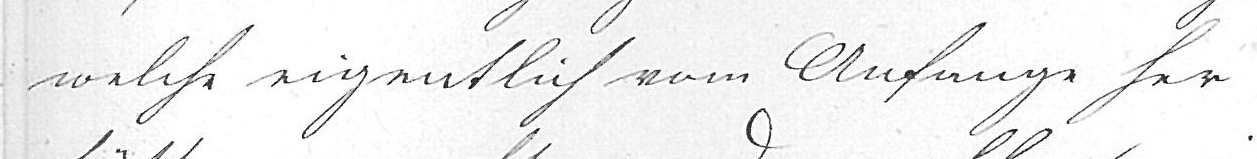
welche eigentlich vom Anfange her
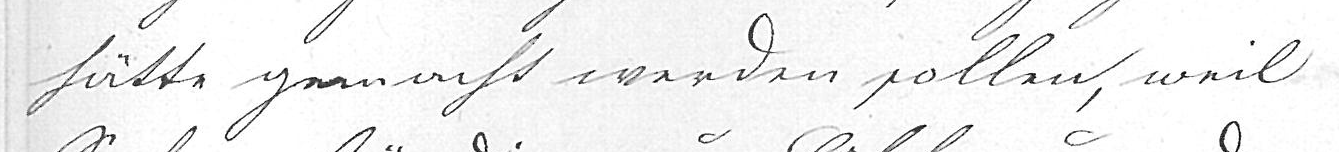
hätte gemacht werden sollen, weil
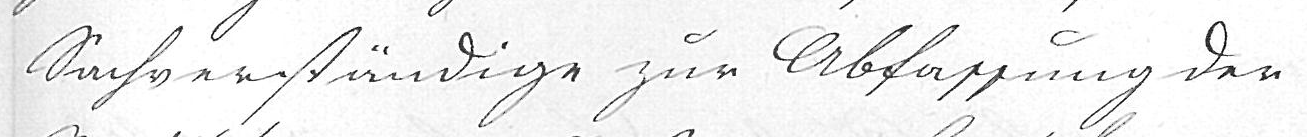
Sachverständige zur Abfassung der
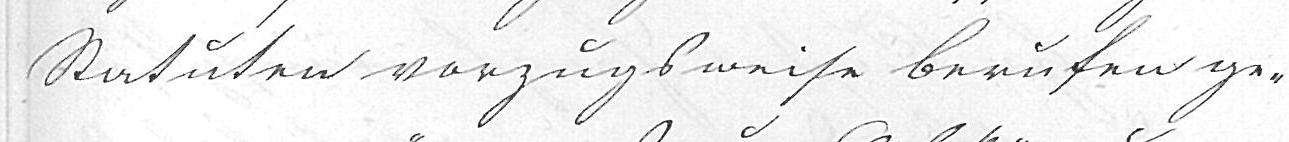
Statuten vorzugsweise berufen ge-
